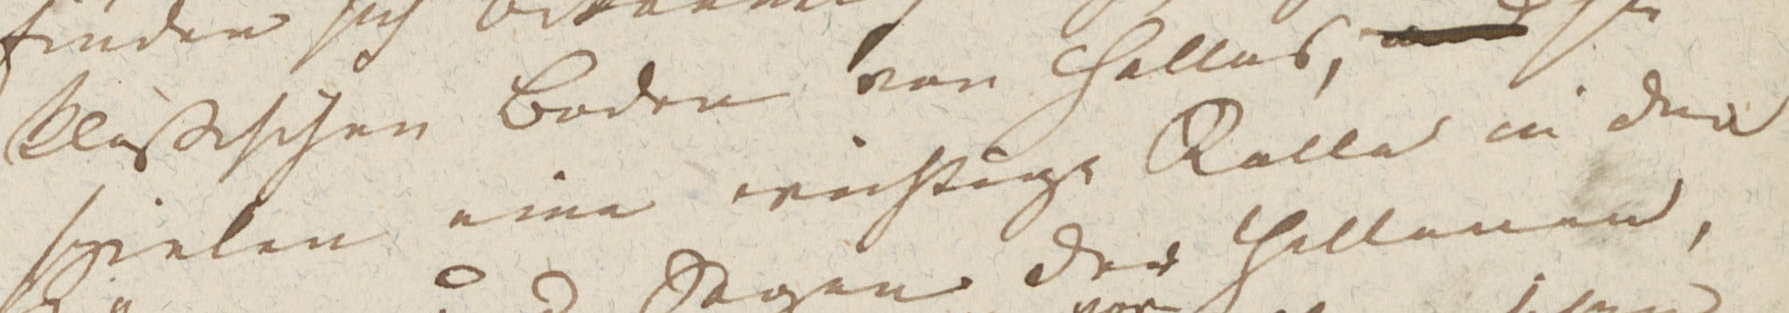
spielen eine wichtige Rolle in dern
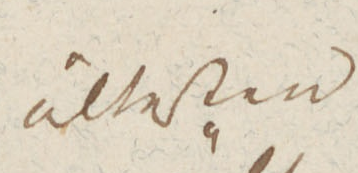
ältesten
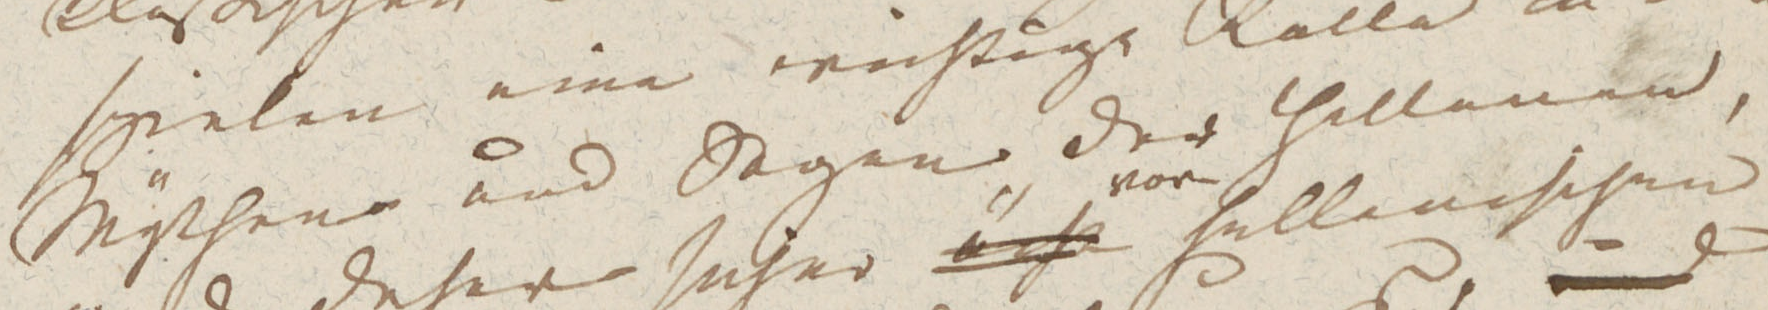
Mythen und Sagen der Hellenen,
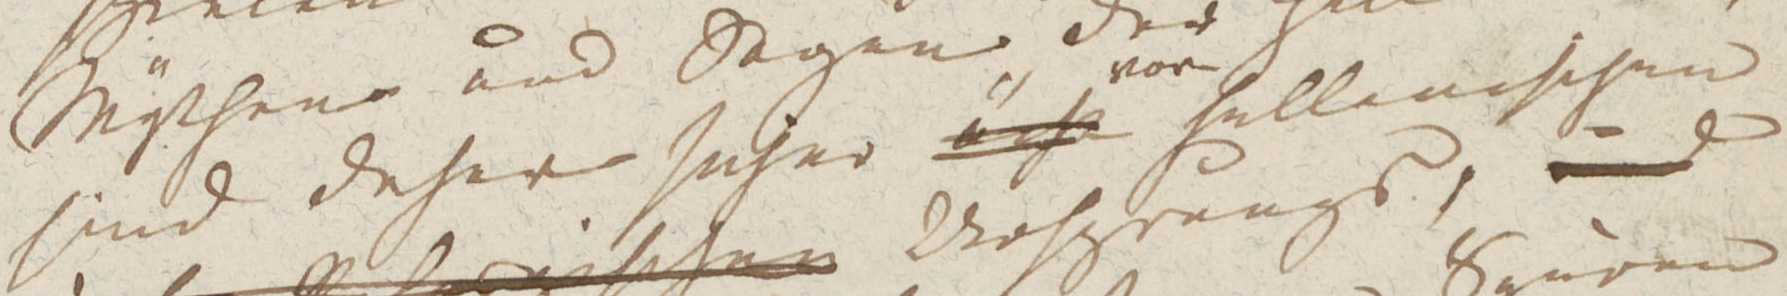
sind daher sicher ächt vor- hellenischen
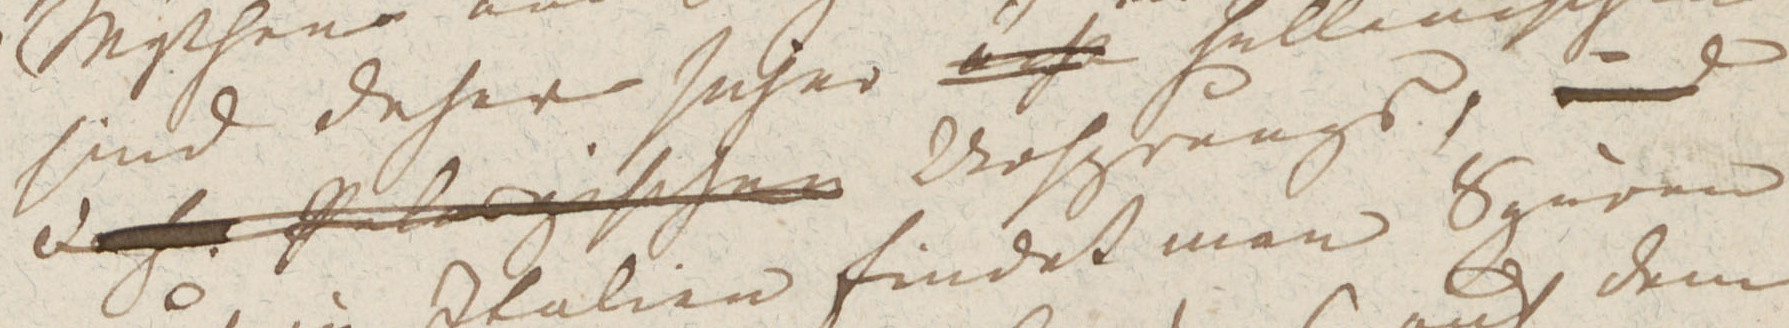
d. h. Pelaspischen Ursprungs, und
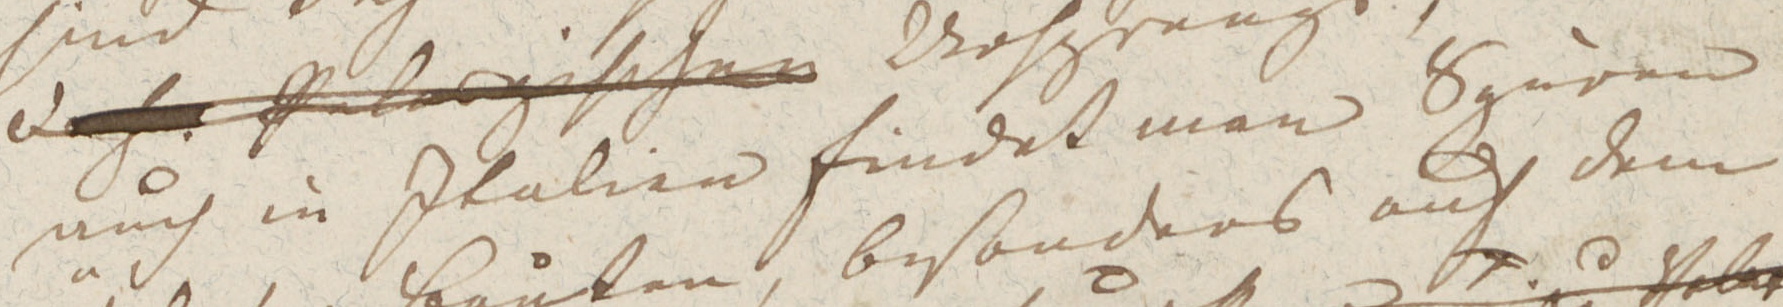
auch in Italien findet man Spuren
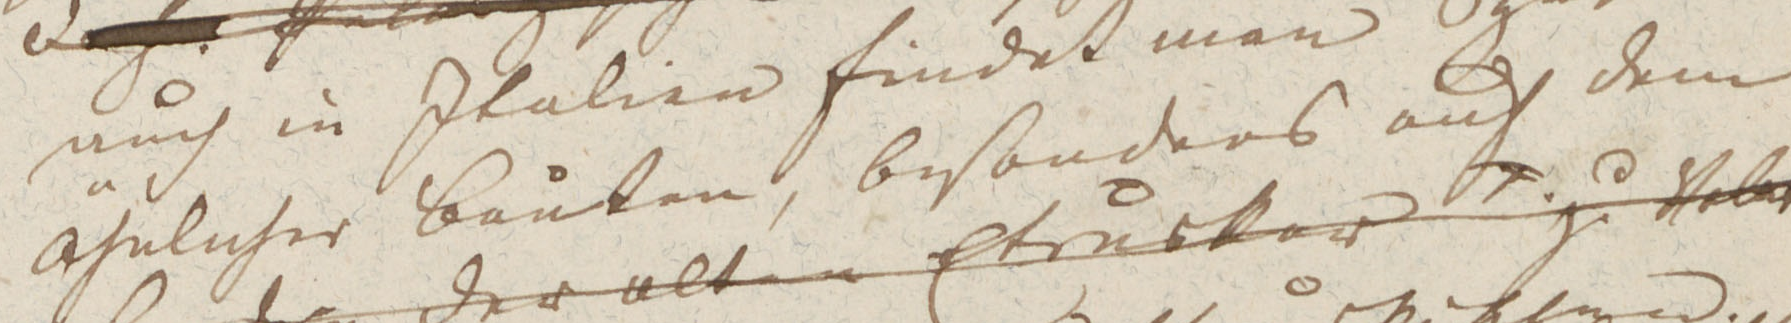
ähnlicher Bauten, besonders auf dem
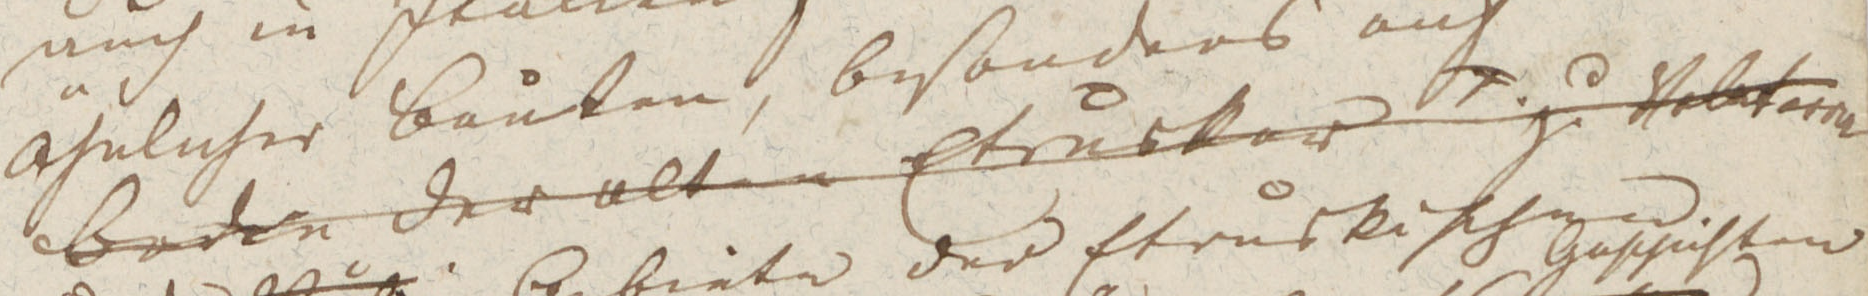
Boden der alten Etrusker zu Volaterne
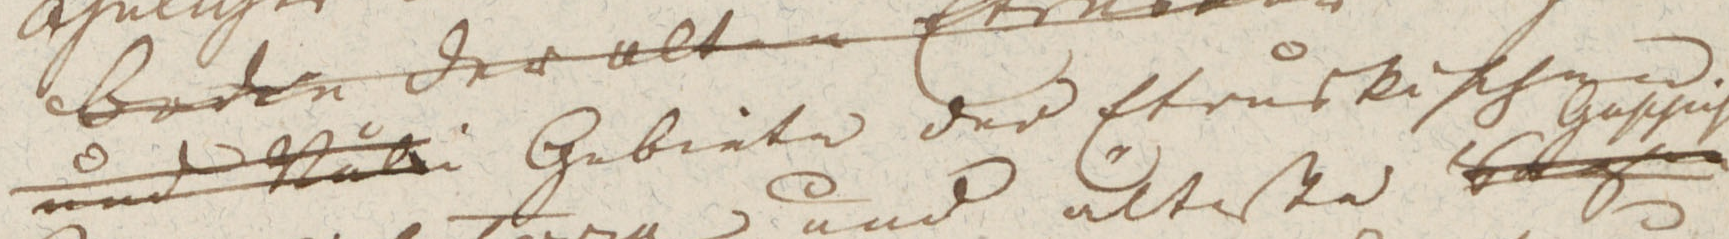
und Vuli Gebiete der Etruskischen
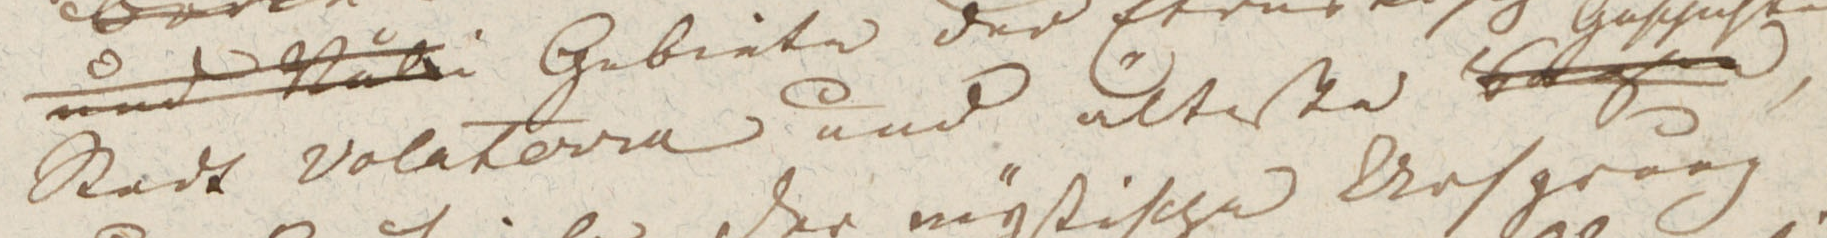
Stadt volateria und älteste Sagen
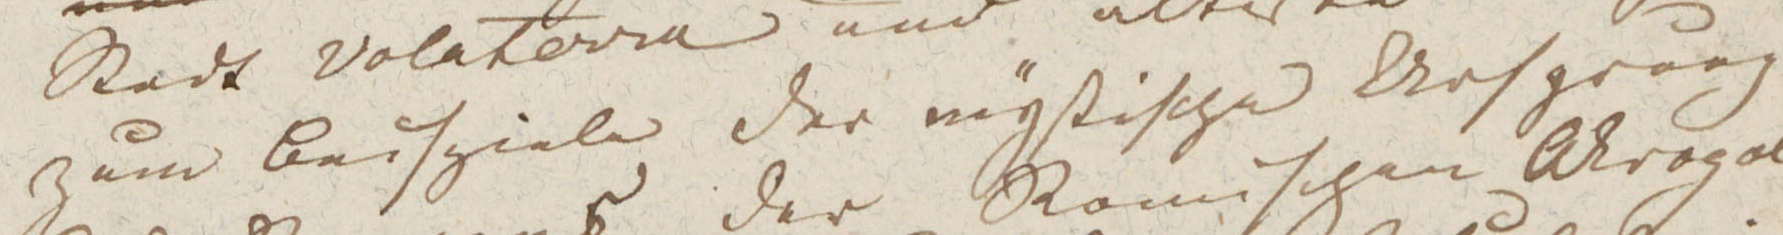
zum Beispiele der mystische Ursprung
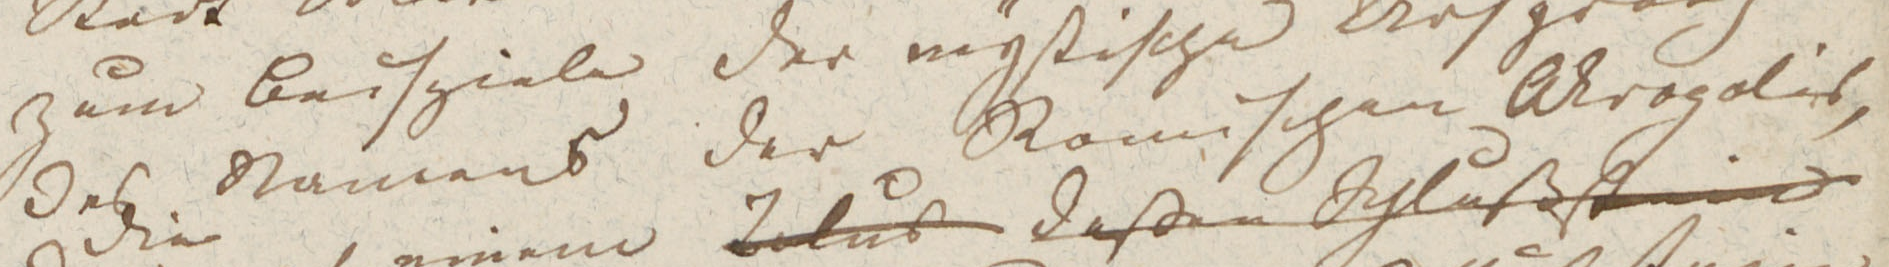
des Namens der Romischen Akropolis,
